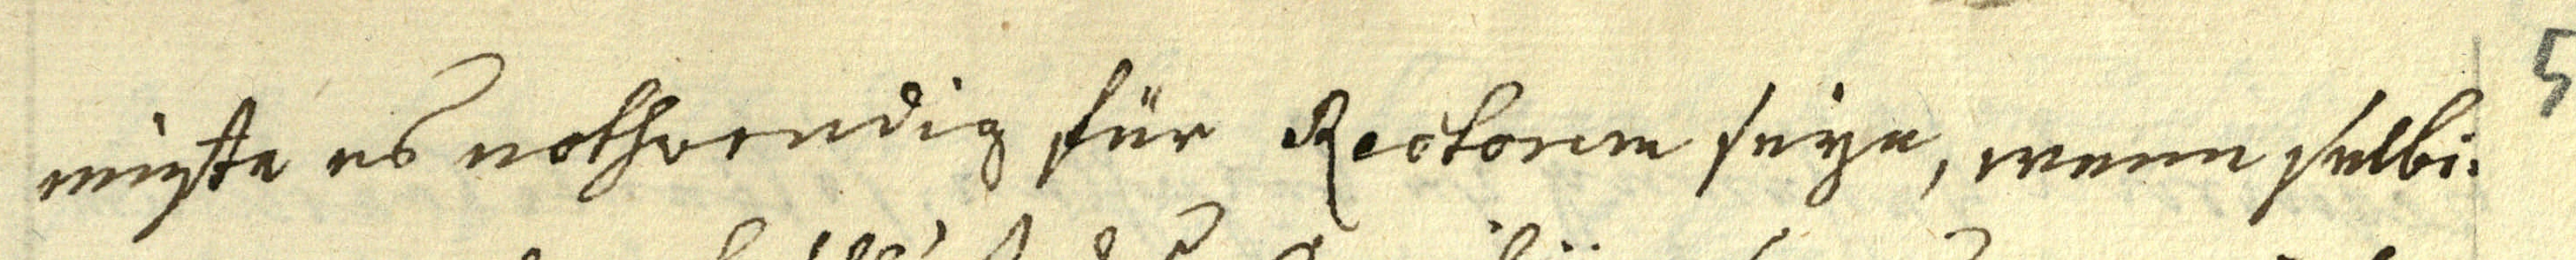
müste es nothwendig für Rectorem seÿn, wenn selbi¬
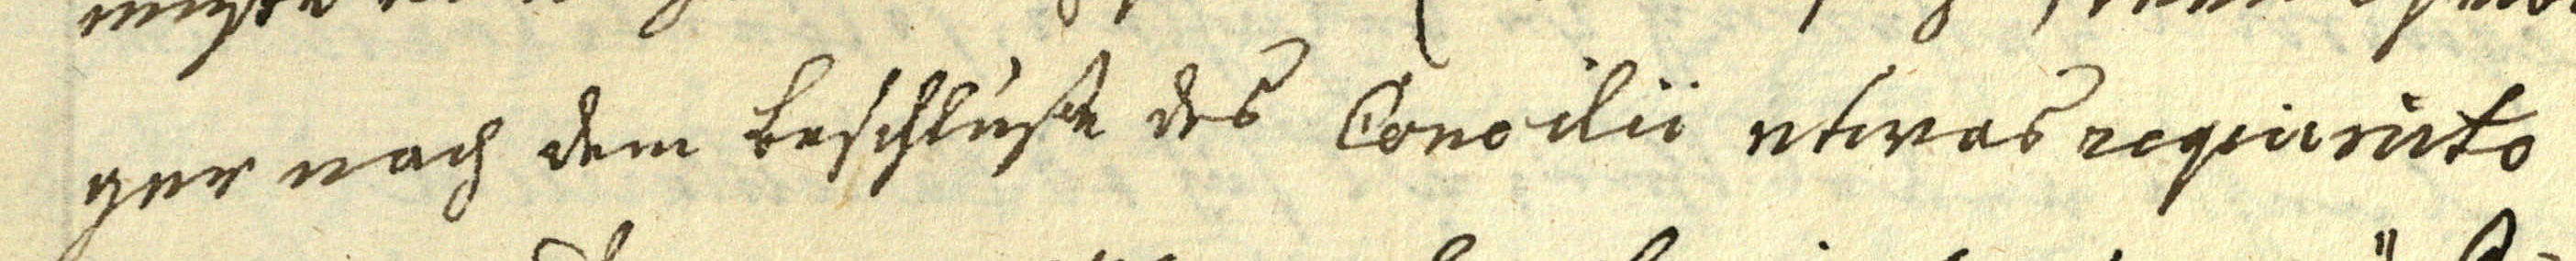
ger nach dem Beschluße des Concilii etwas requirirte
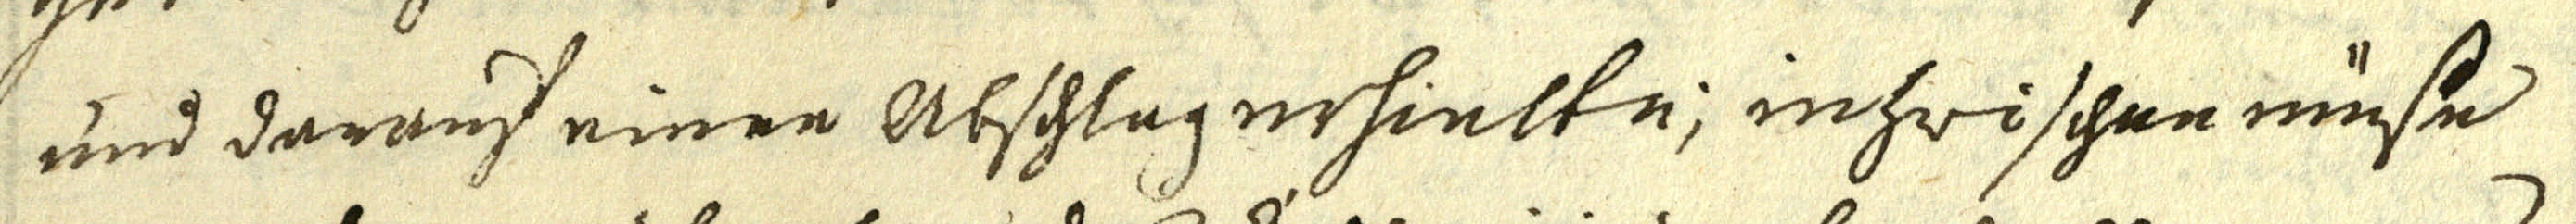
und darauf einen Abschlag erhielte, inzwischen müße
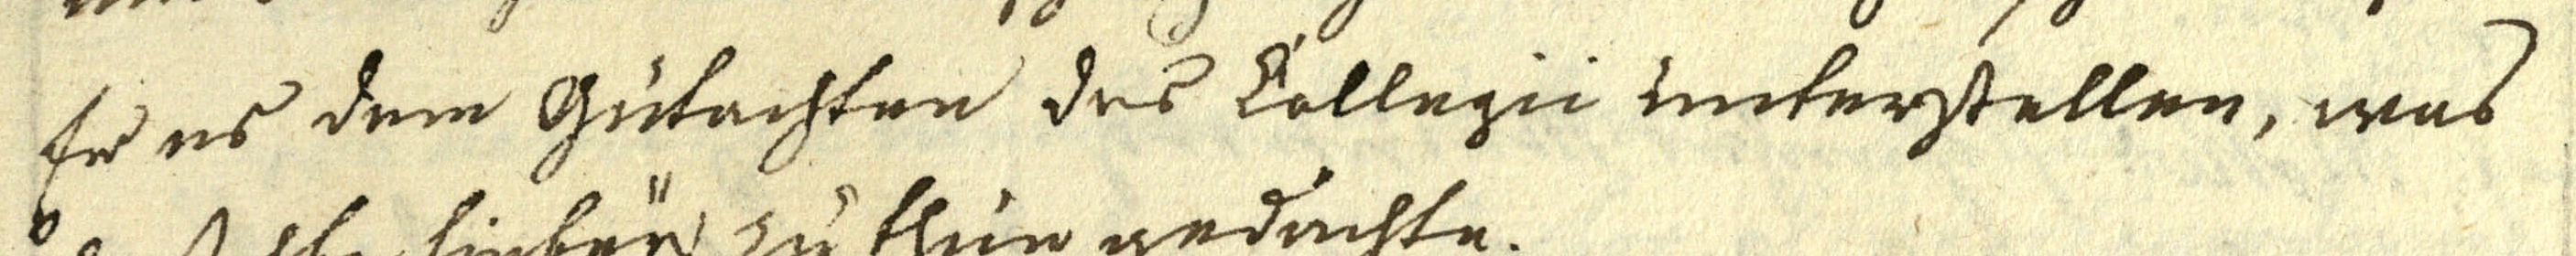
Er es dem Gutachten des Collegii unterstellen, was
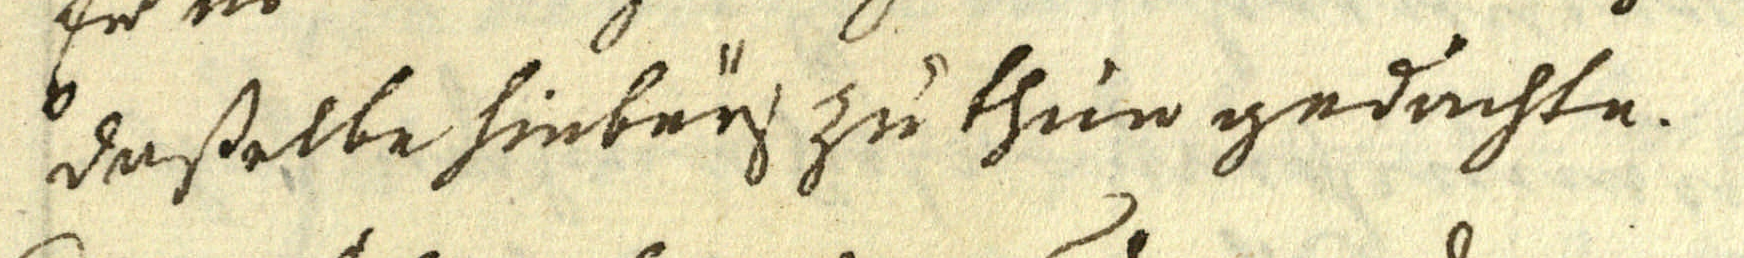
daßelbe hiebeÿ zu thun gedachte.
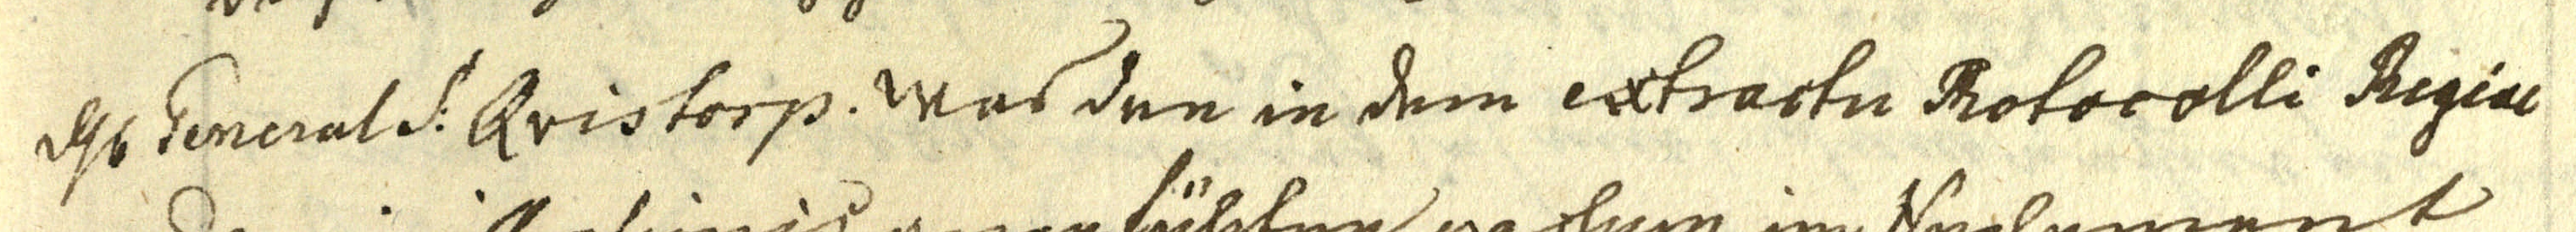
dh GeneralS. Quistorp. Was den in dem extractu Protocolli Regiae
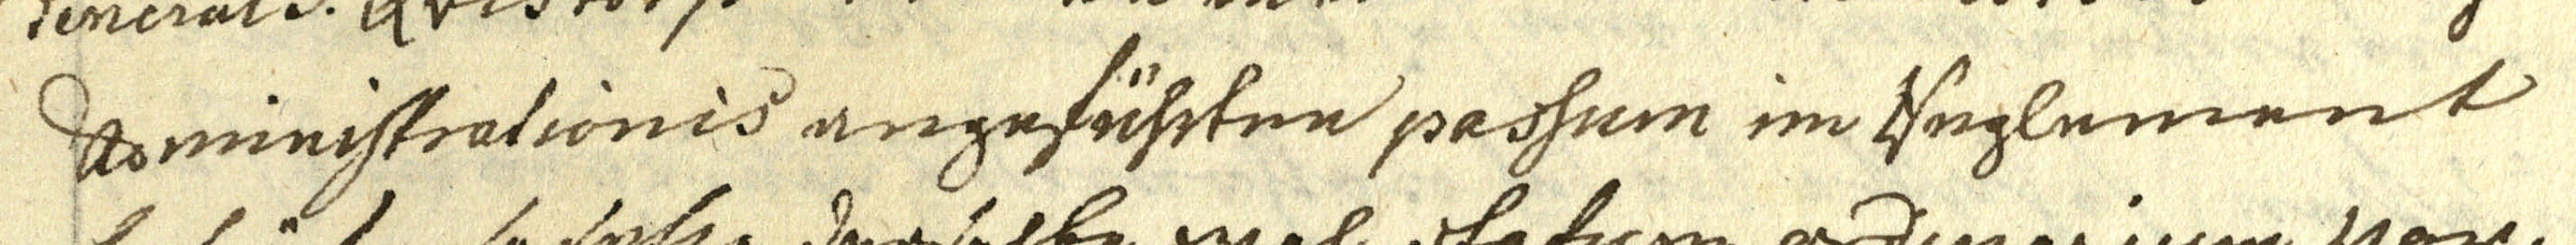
Administrationis angeführten passum im Reglement
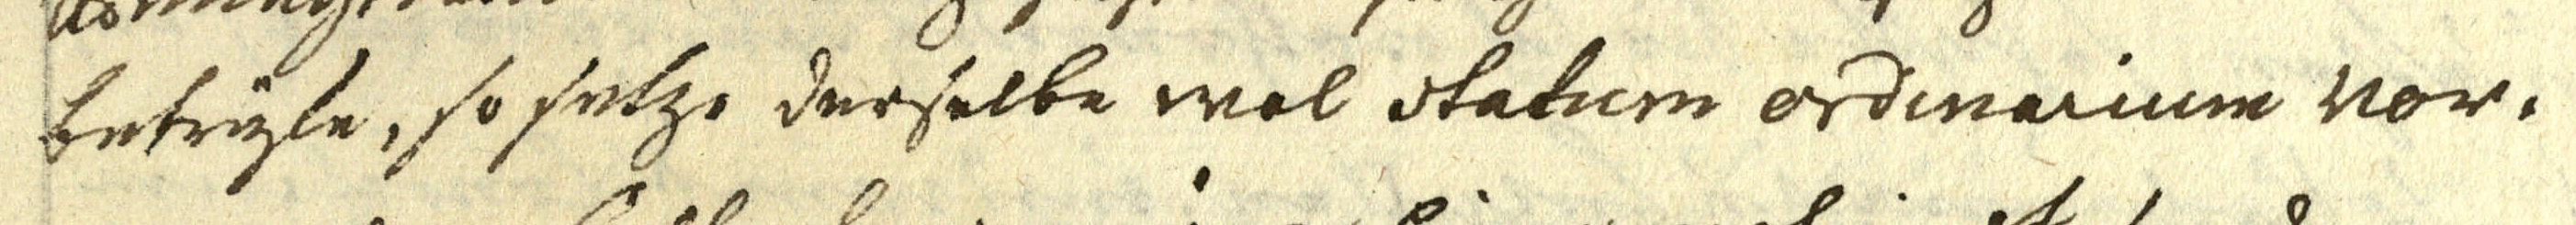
beträfe, so setze derselbe wol statum ordinarium vor¬
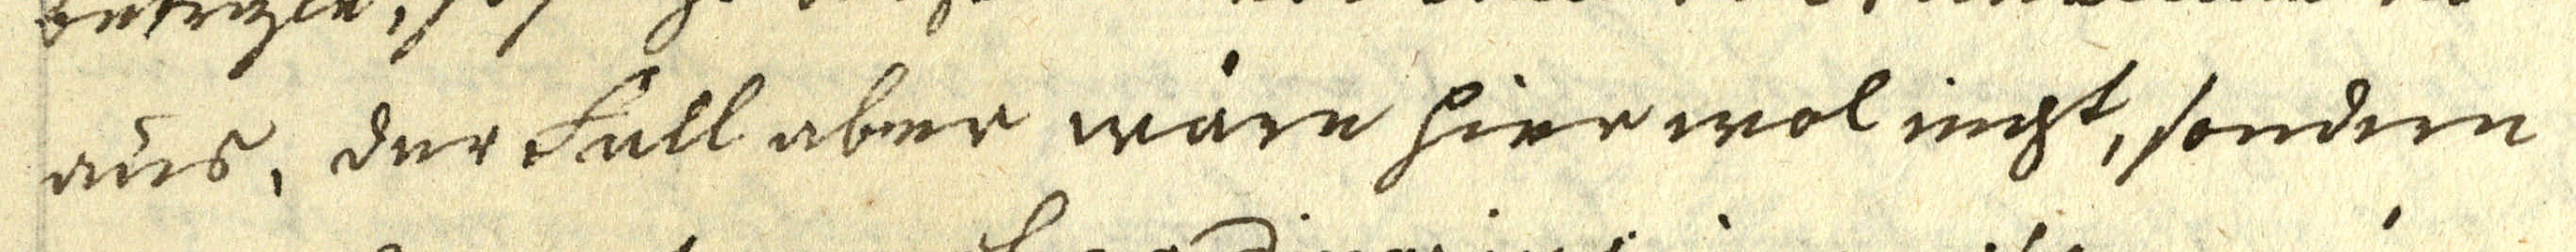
aus, der Fall aber wäre hier wohl nicht, sondern
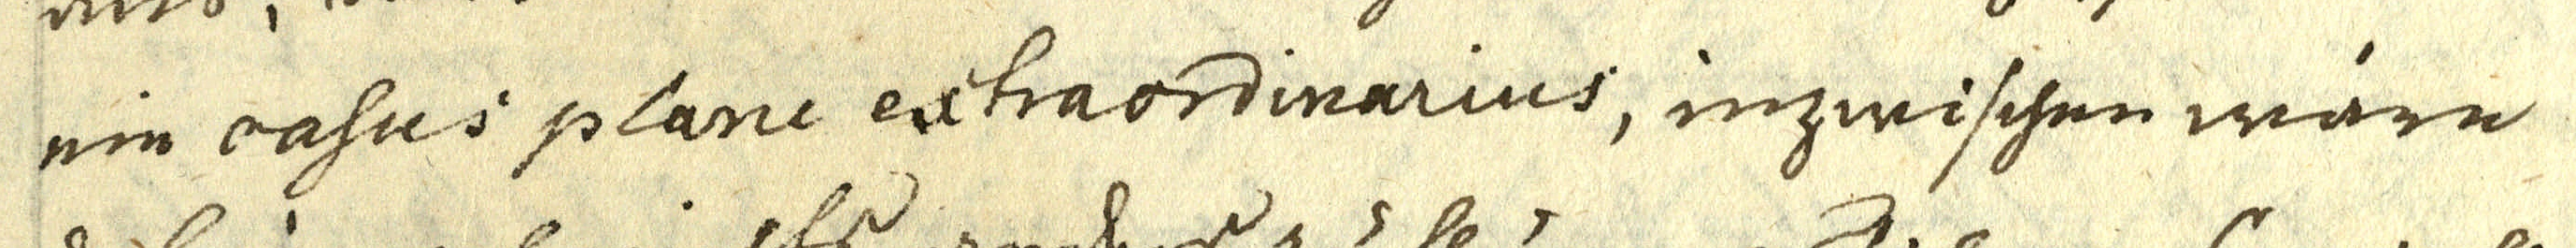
ein casus plane extraordinarius, inzwischen wäre
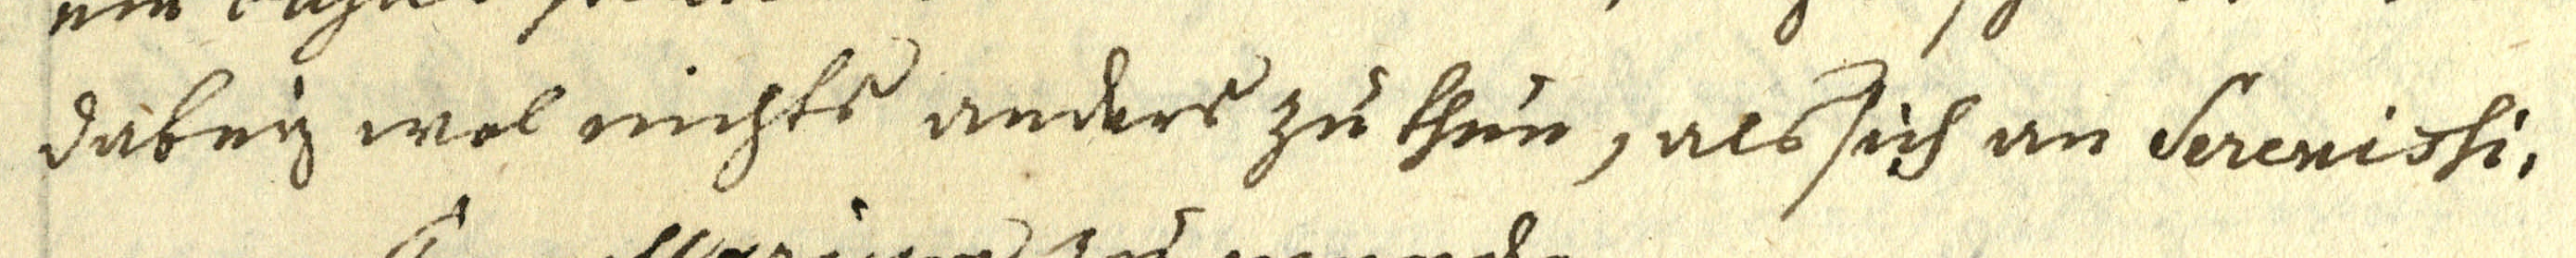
dabeÿ wol nichts anders zu thun, als sich an Serenissi¬
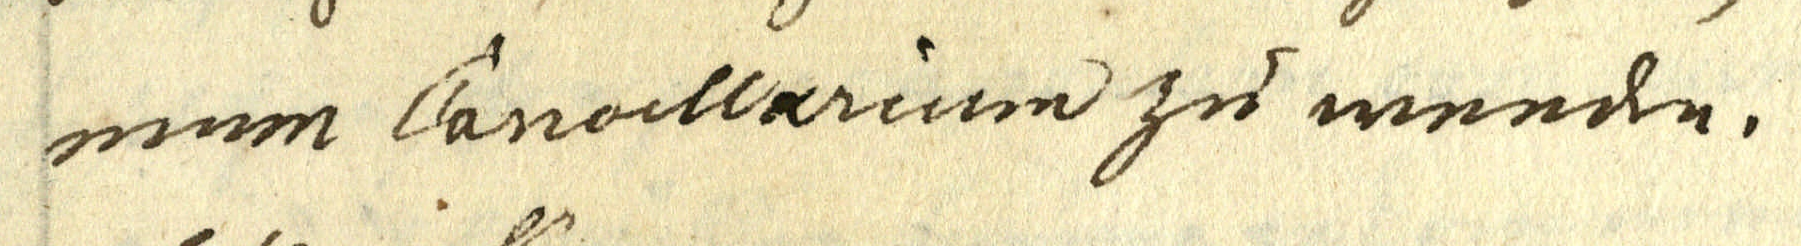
mum Cancellarium zu wenden.
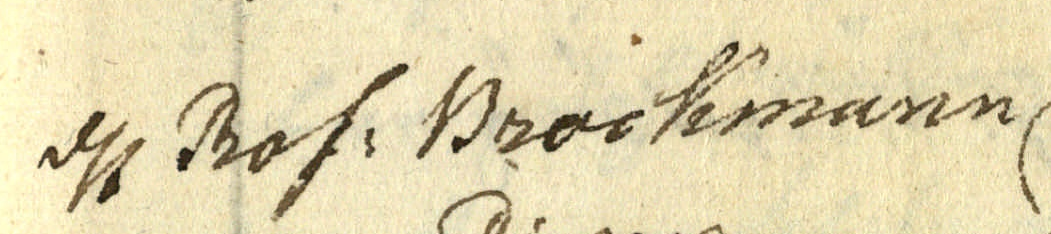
dh Prof. Brockmann
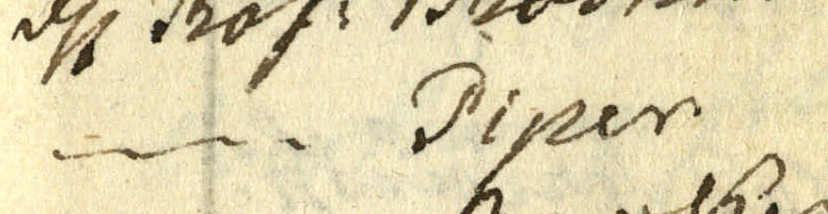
Piper
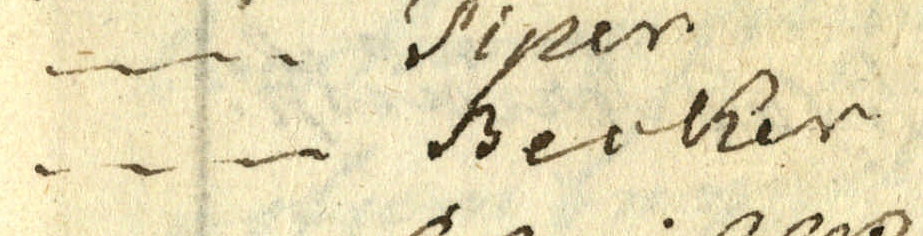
Becker
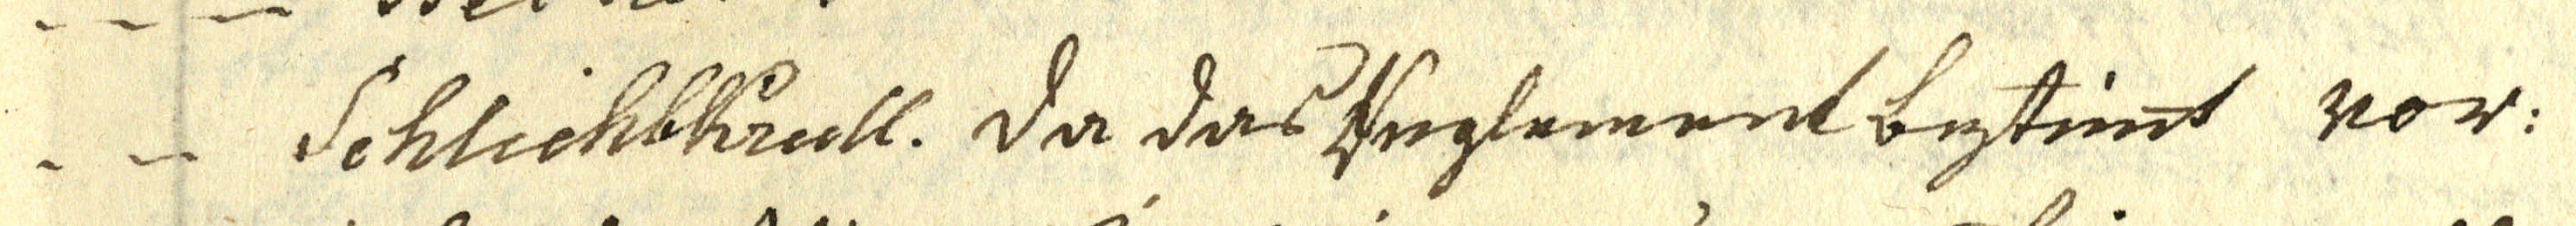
Schlichtkrull. Da das Reglement bestimt vor¬
